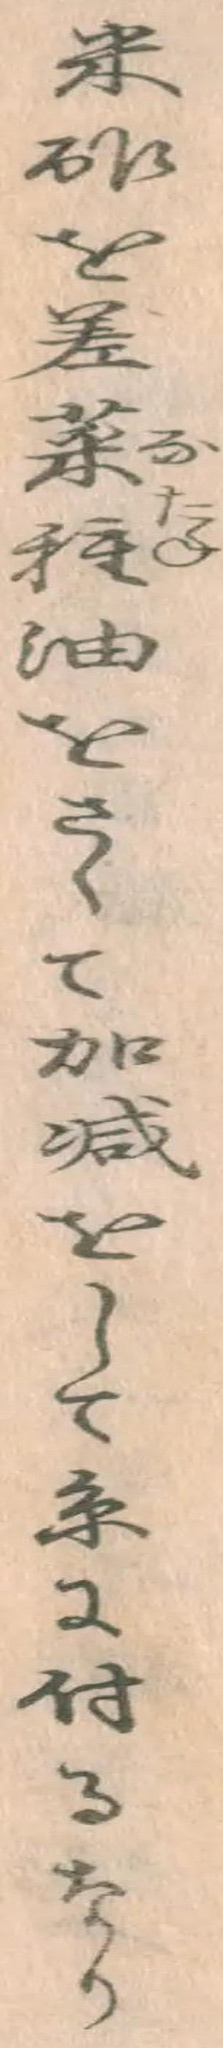米酢を差菜種油をさして加減をして糸に付るなり
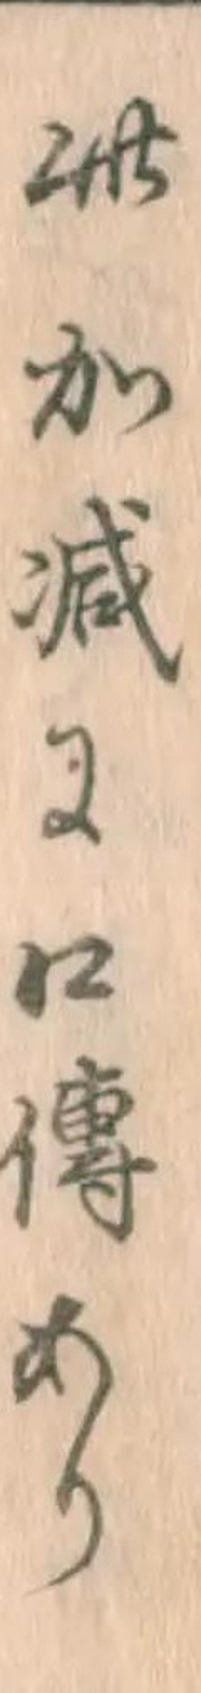此加減に口伝あり
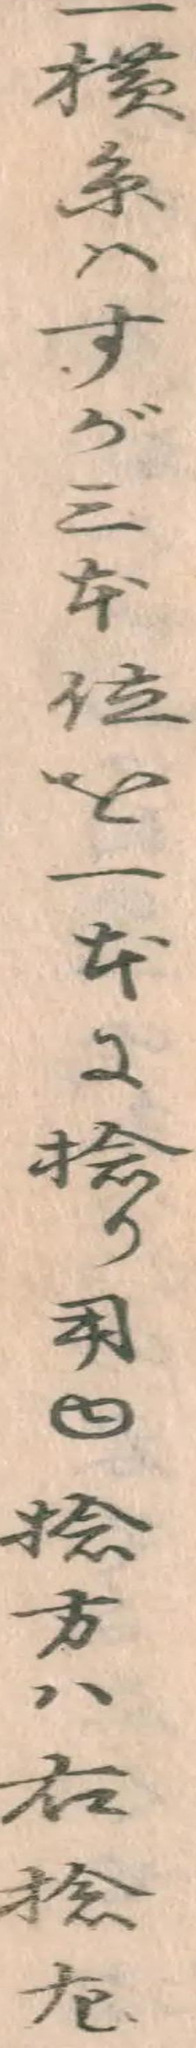一横糸はすが三本位を一本に捻り用ゆ捻方は右捻左
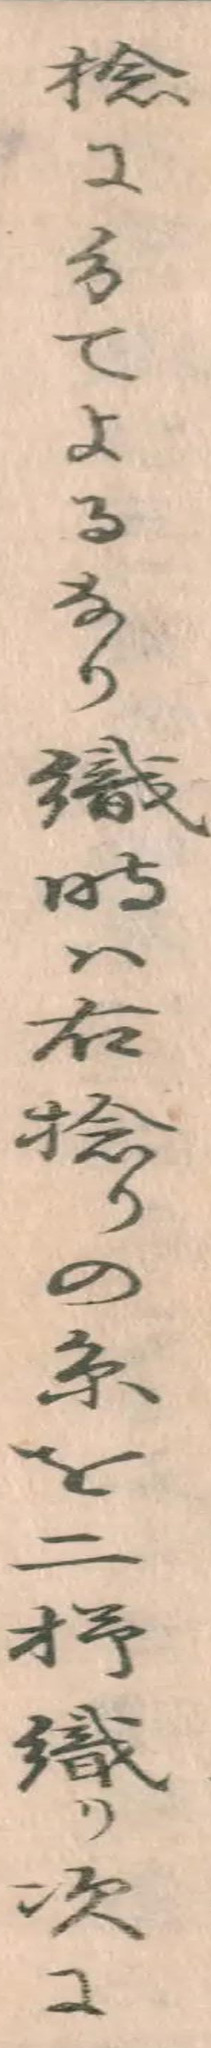捻に分てよるなり織時は右捻りの糸を二杼織り次に
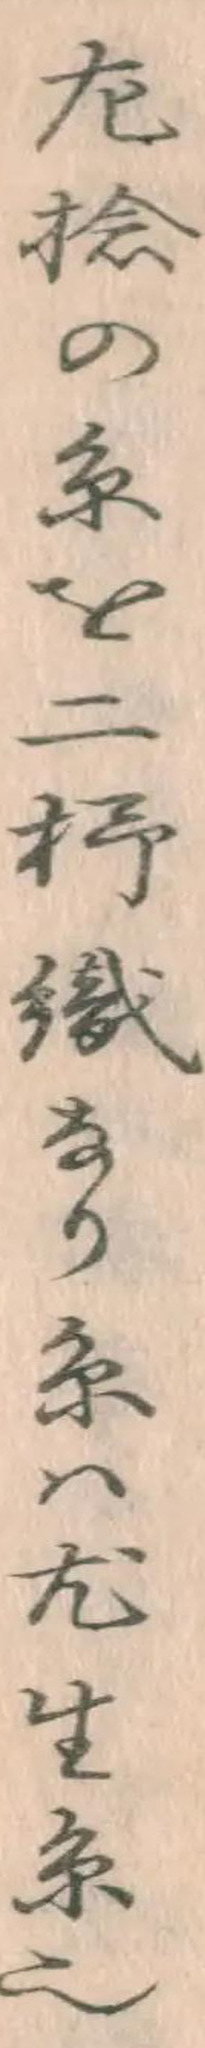左捻の糸を二杼織なり糸は尤生糸也
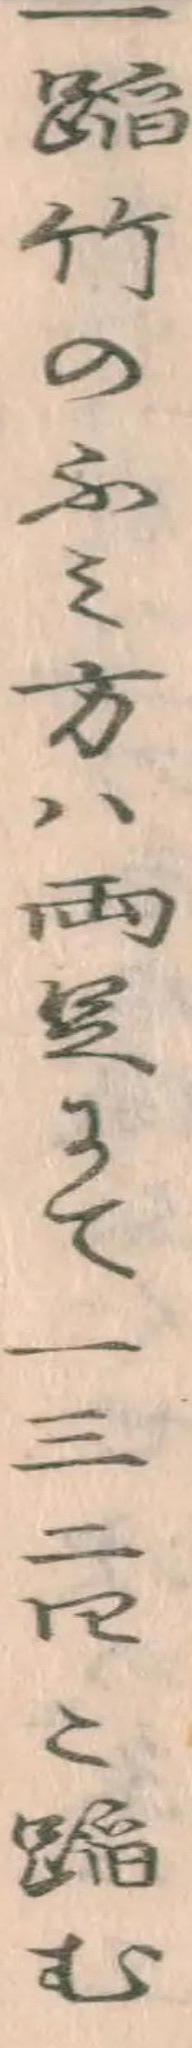一蹈竹のふみ方は両足にて一三二四と蹈む
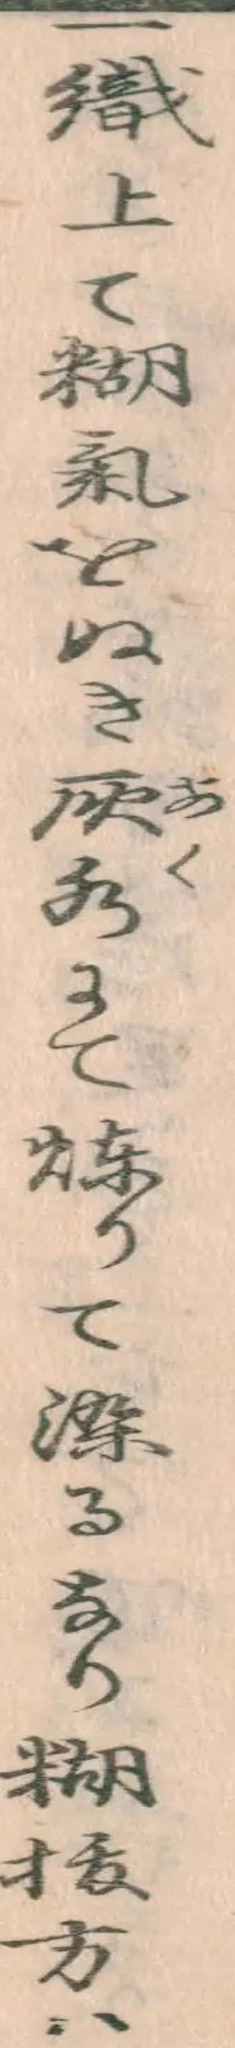一織上て糊気をぬき灰水にて煉りて染るなり糊抜方は
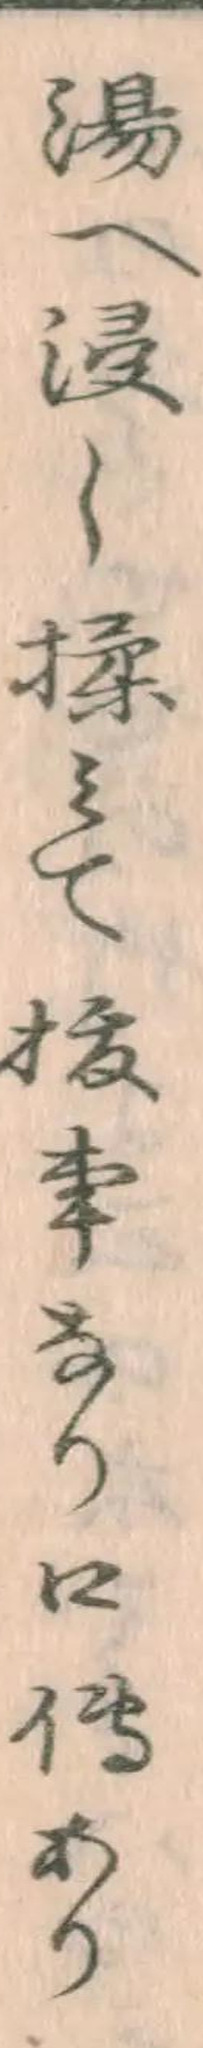湯へ浸し揉みて抜事なり口伝あり
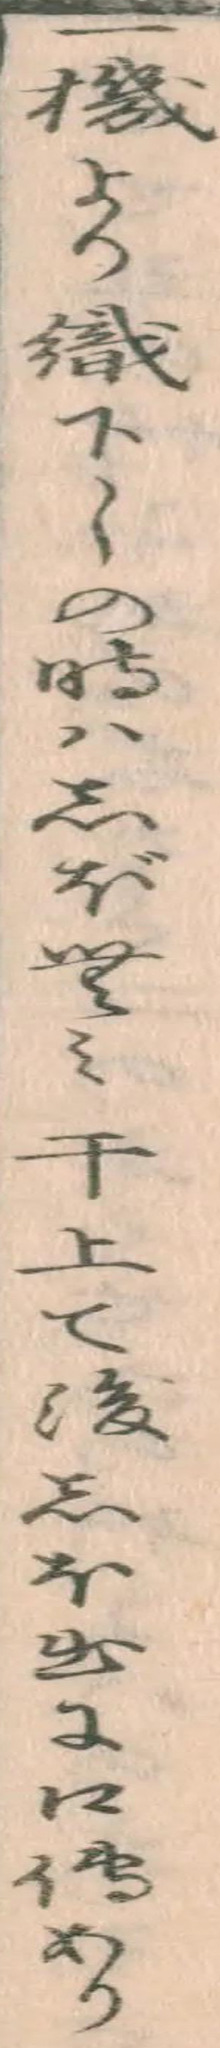一機より織下しの時はしぼ無之干上て後しほ出に口伝あり
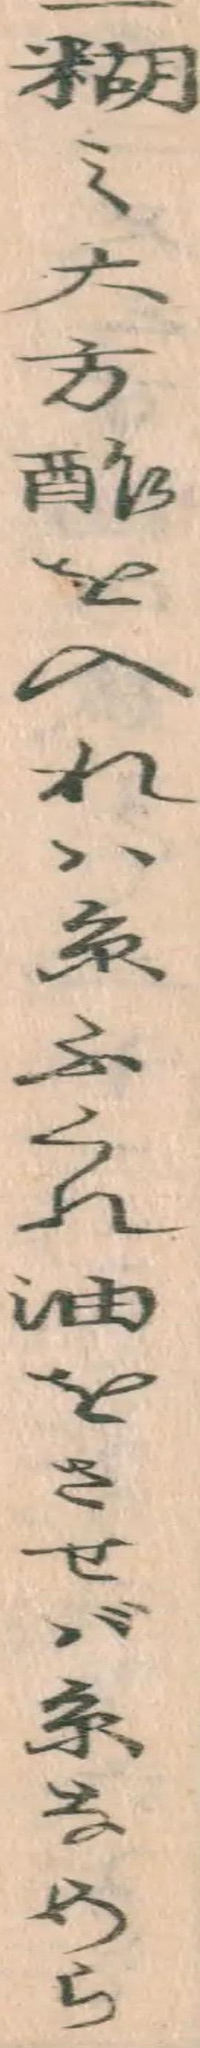一糊之大方酢を入れは糸ふくれ油をさせば糸なめら
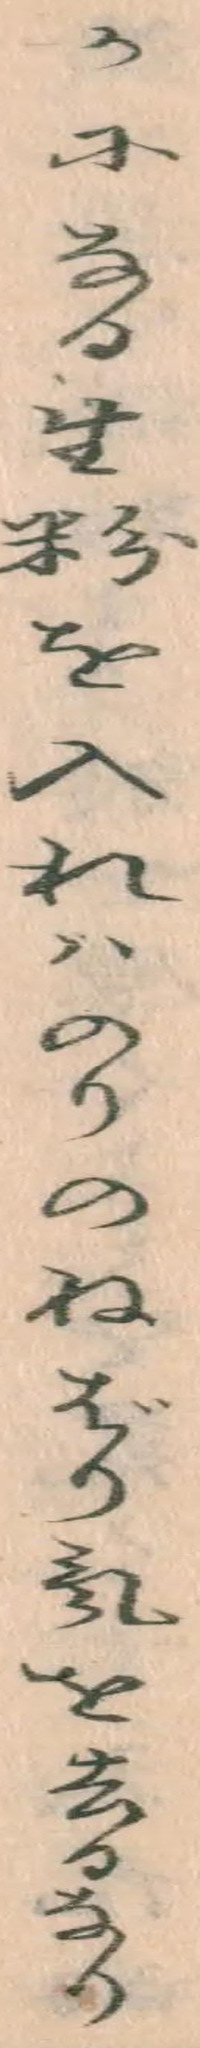かになる生粉を入れはのりのねばり気を去るなり
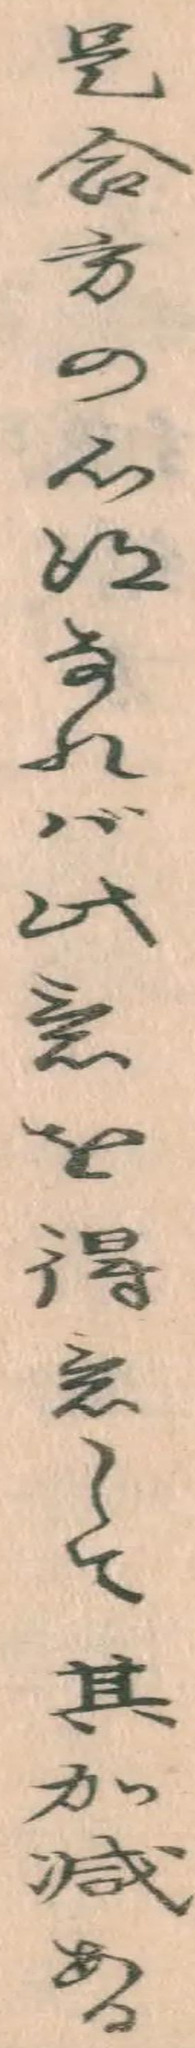是合方の心得なれば此意を得意して其加減ある
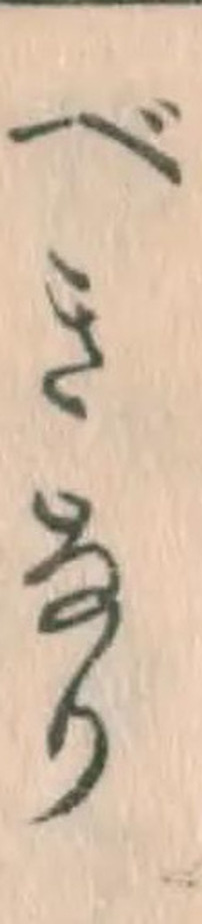べきなり
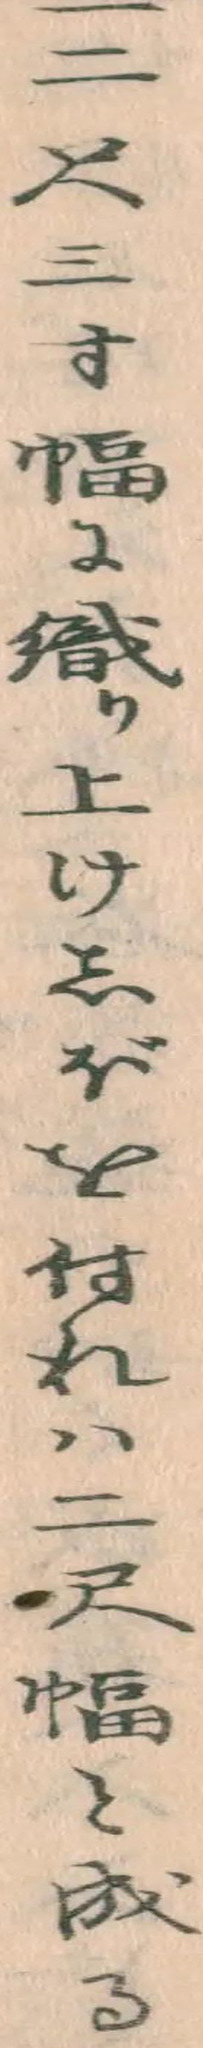一二尺三寸幅に織り上けしぼを付れは二尺幅と成る
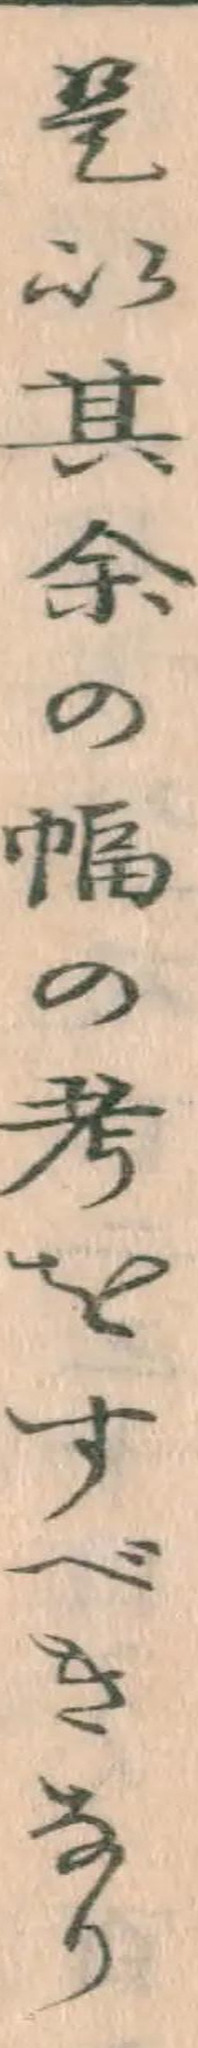是以其余の幅の考をすべきなり
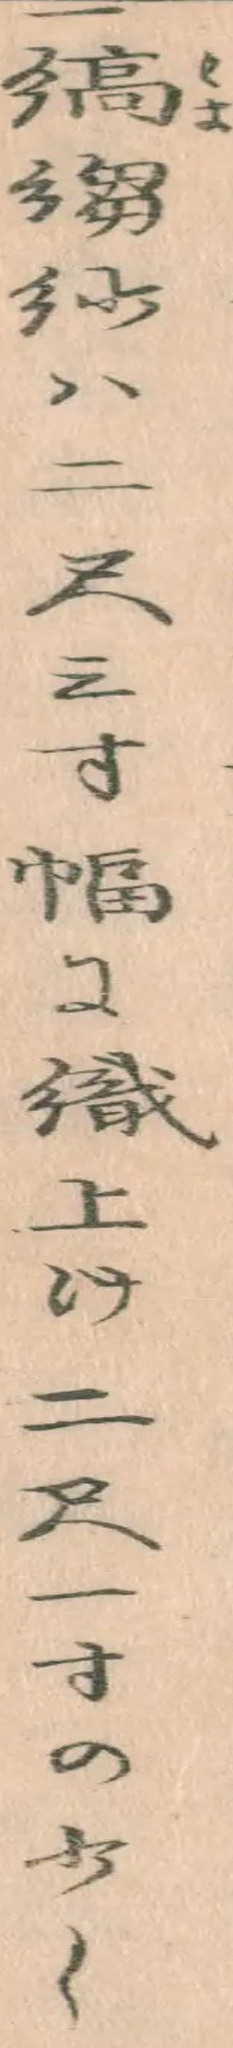一縞縐紗は二尺三寸幅に織上け二尺一寸の少し
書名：機織彙編 5巻. [2]
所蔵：国立国会図書館 National Diet Library, JAPAN
